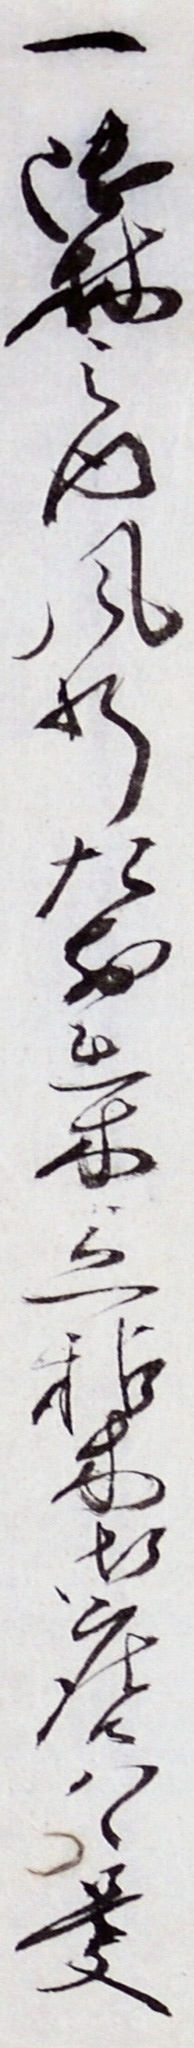一御林之内風折たおれ木立枯木御座候ハヽ是又
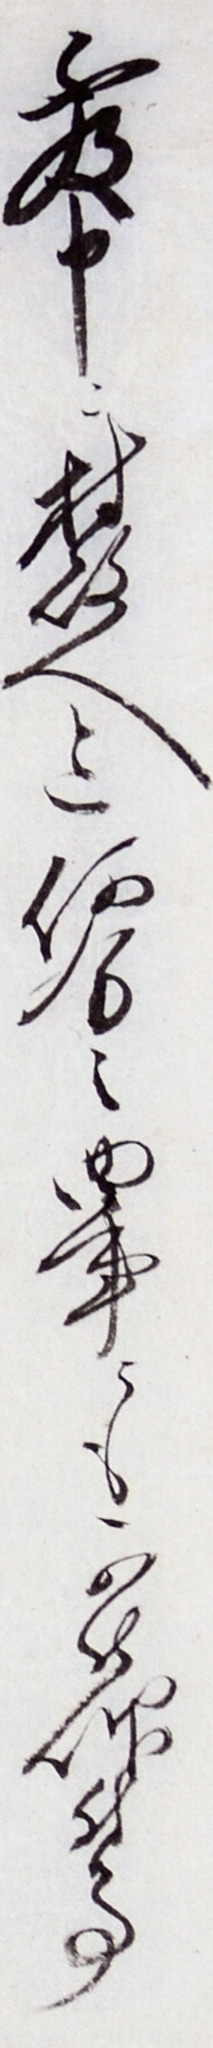不及申ニ村役人迄何分之曲事ニも可被仰付事
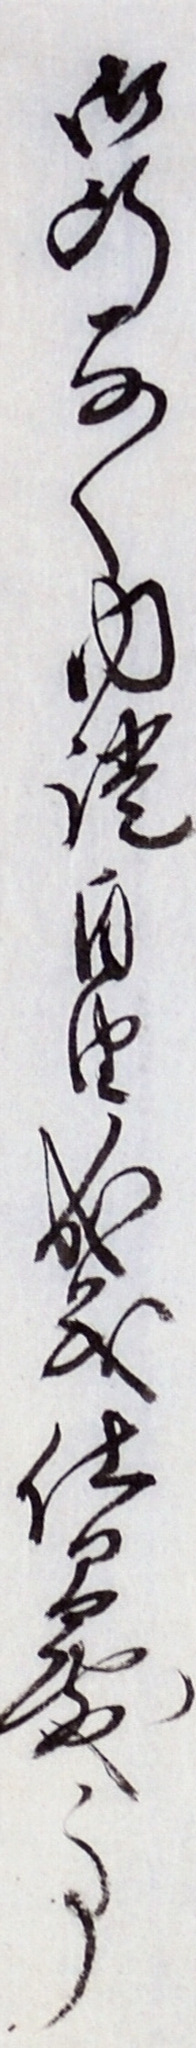御断なく内証自由成義仕間敷候事
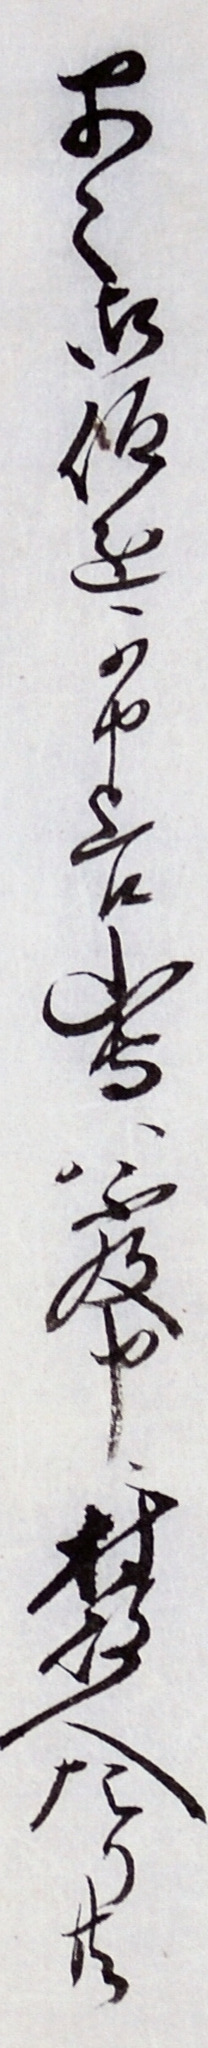早々御註進可申上候山守ハ不及申ニ村役人たり共
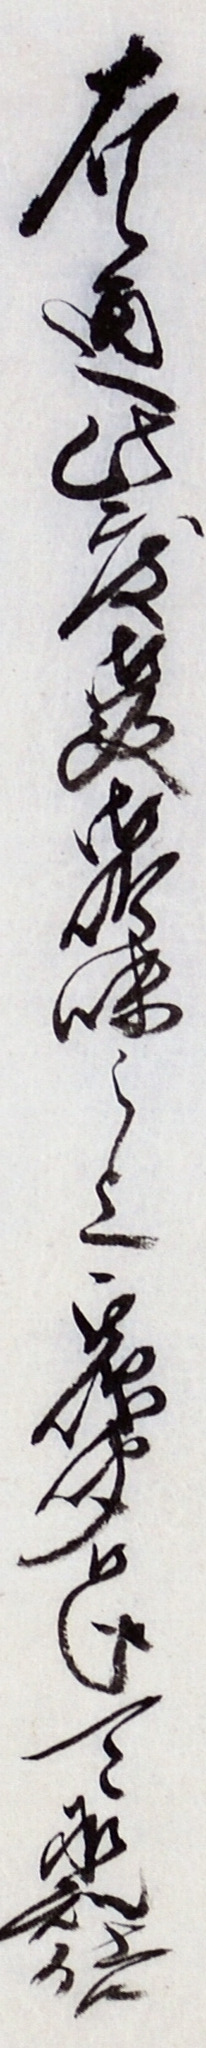右之通此度御改御吟味之上被仰聞候趣一々承知仕候
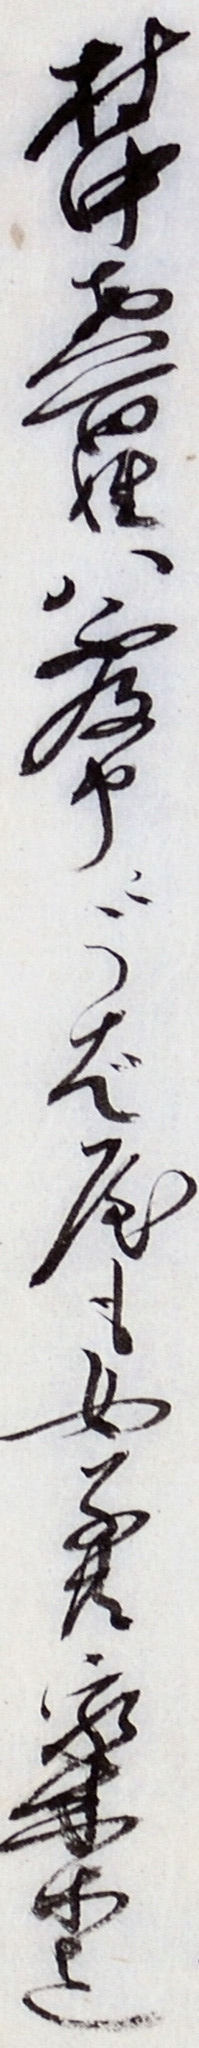村中惣百姓ハ不及申ニうばやも女子共家来等迄
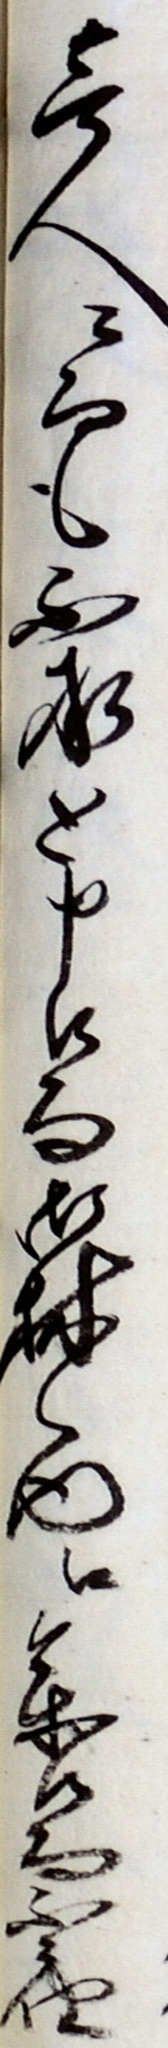壱人ニ而も不承と申候而御林之内え参候而不届
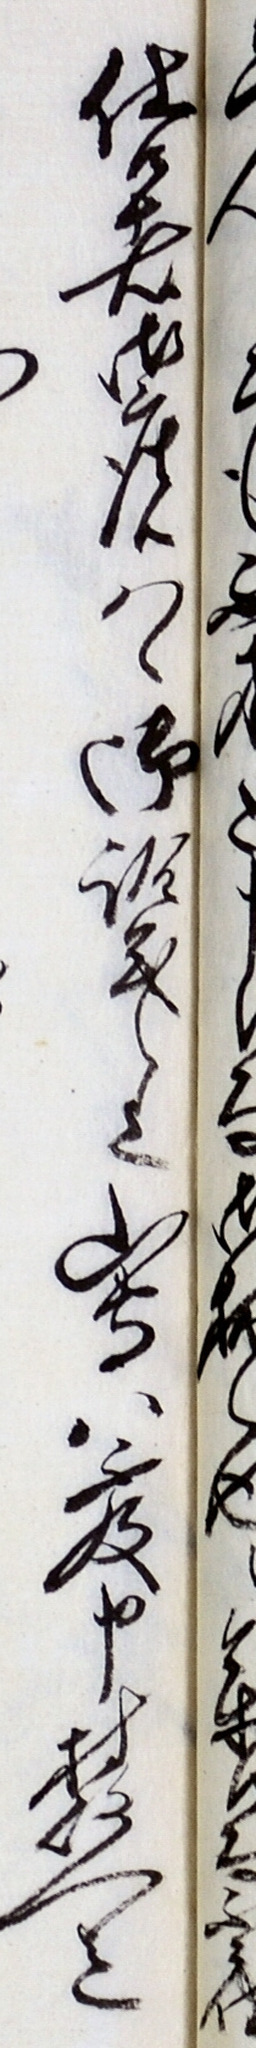仕候者御座候ハヽ御詮義之上山守ハ不及申村役人迄
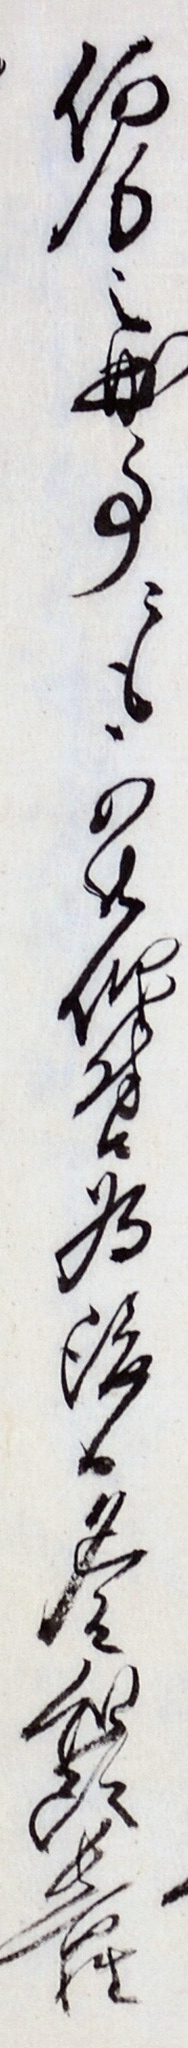何分之曲事ニも可被仰付候為後日名主組頭長百姓
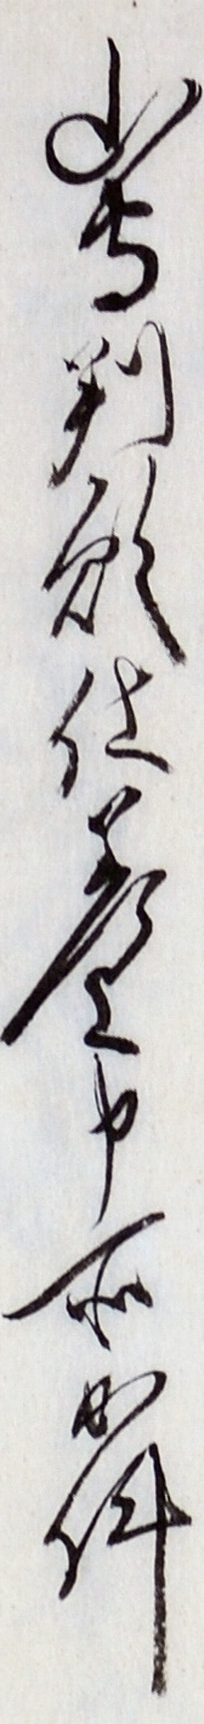山守判願仕差上申所如件
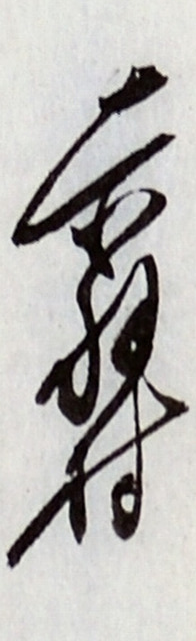赤羽村
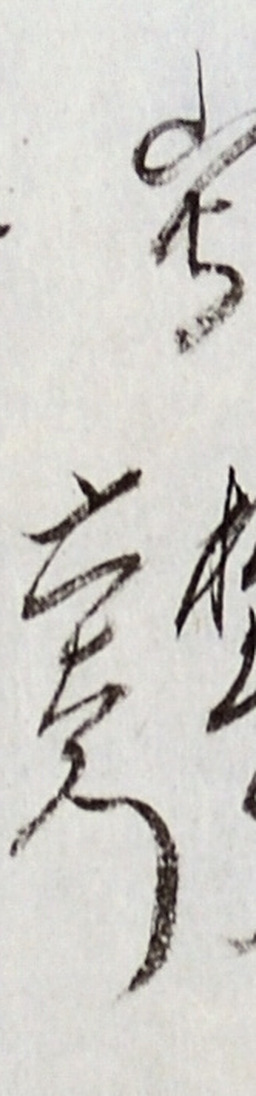六右衛門
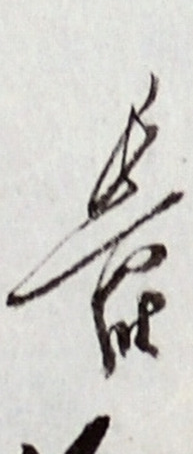長百姓

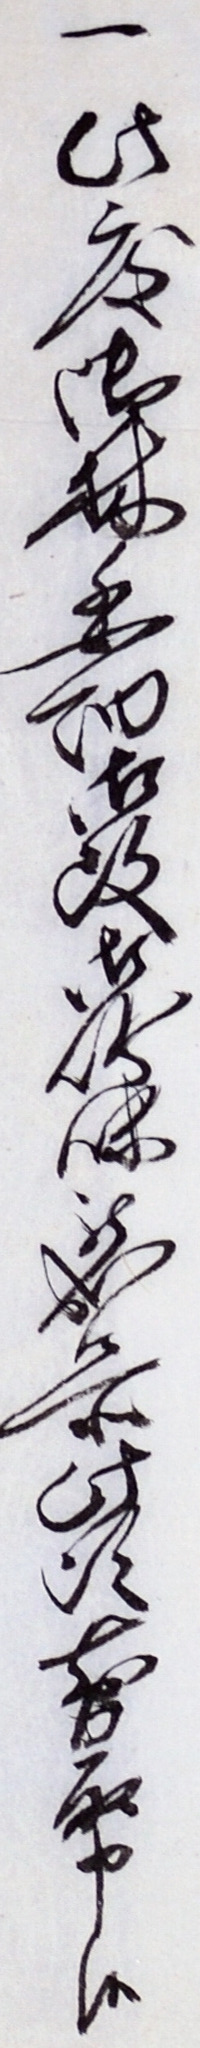一此度御林委細御改御吟味被成候所此頃剪取申候
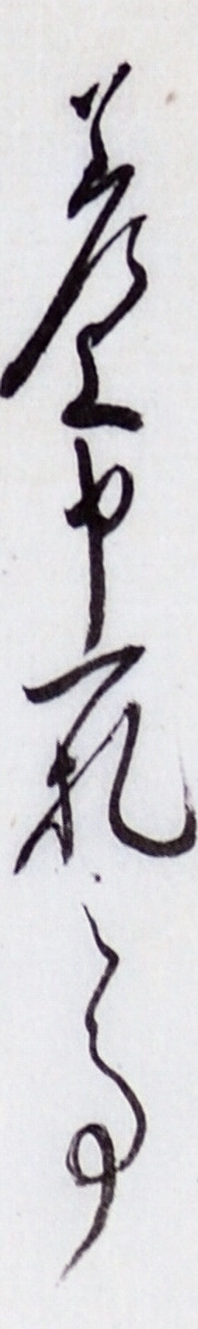差上申一札之事
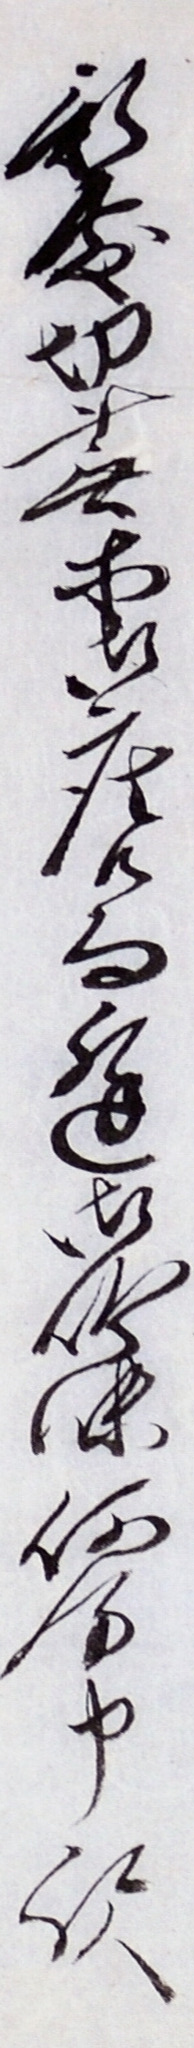新敷切蕪等御座候而逢御吟味何分申訳
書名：御林御竹藪証文控
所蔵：伊那市立高遠町図書館・合同会社AMANE
